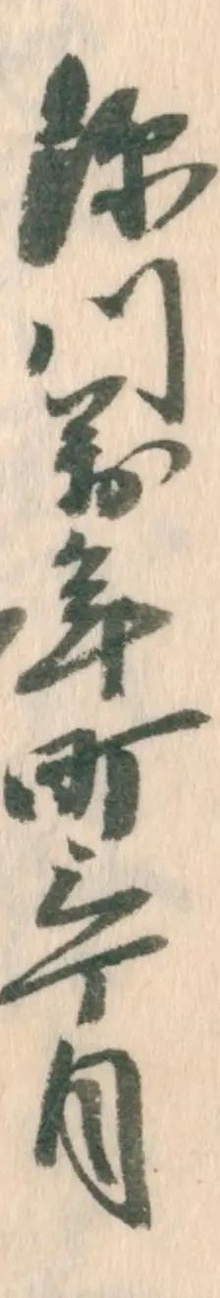深川万年町三丁目
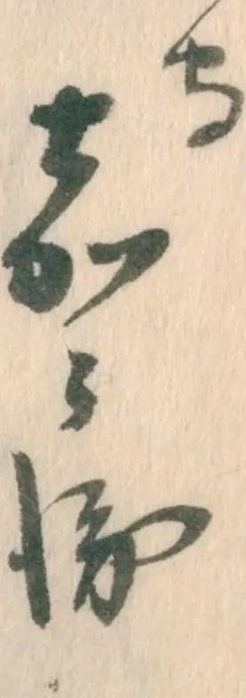嘉兵衛

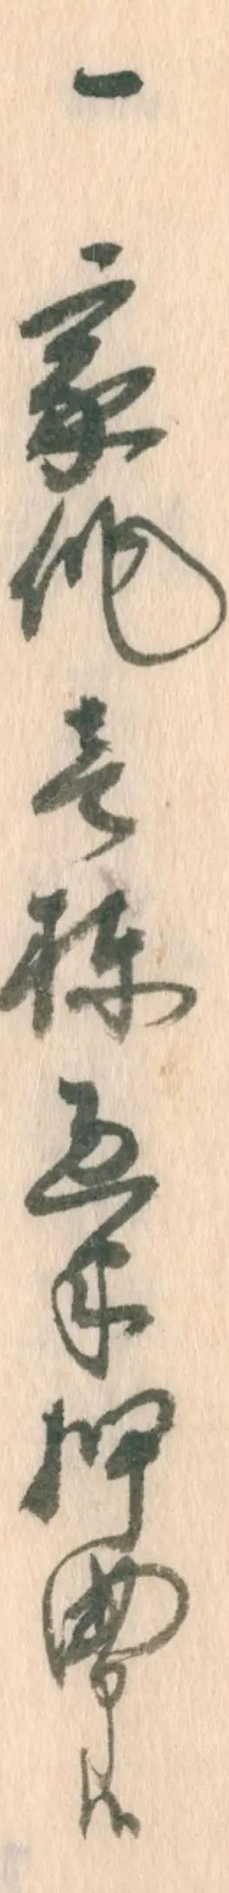一家作壱棟過半押曲申候
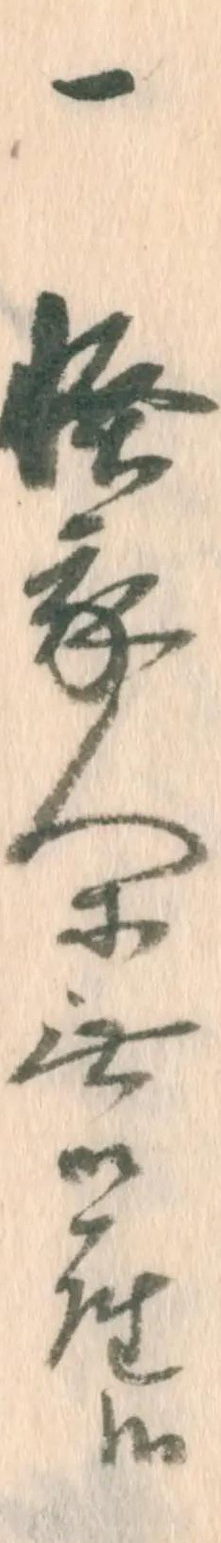一怪我人等無御座候
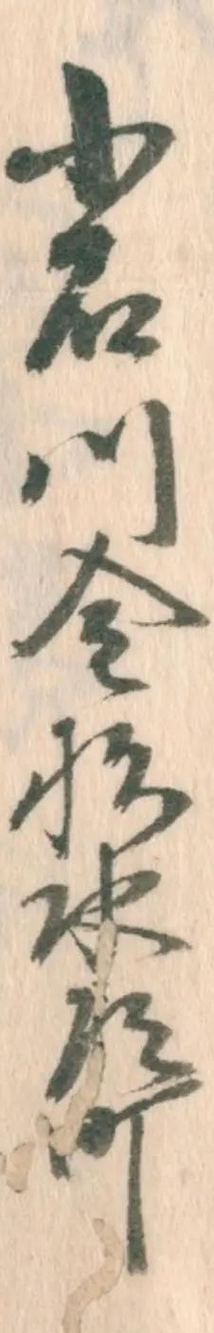小石川金杉水道町
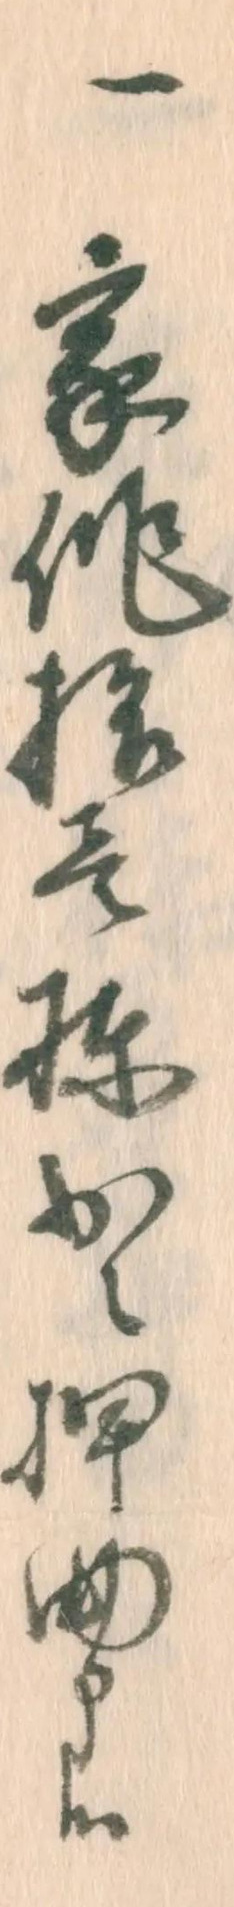一家作拾壱棟少し押曲申候
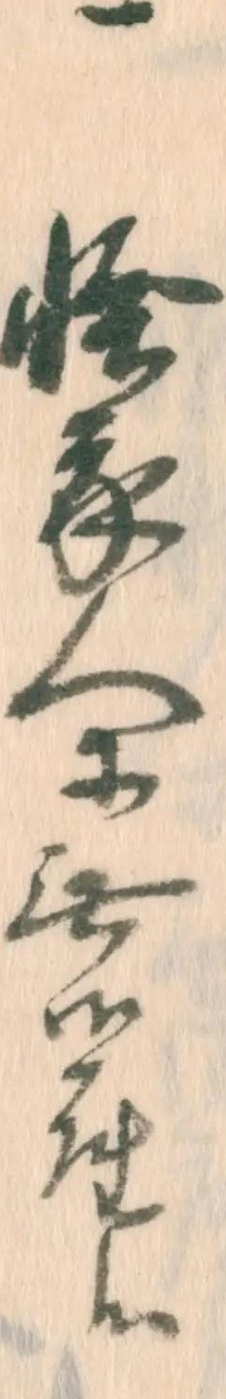一怪我人等無御座候
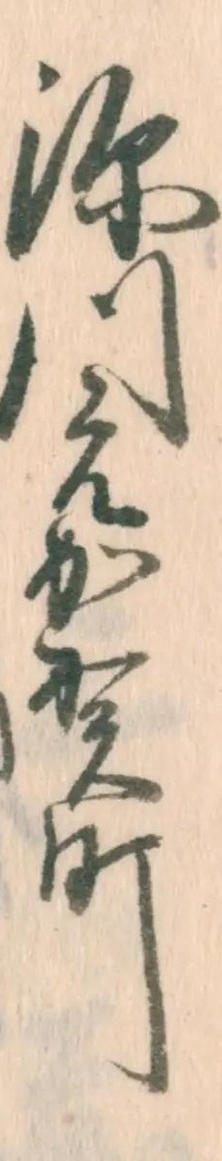深川元加賀町
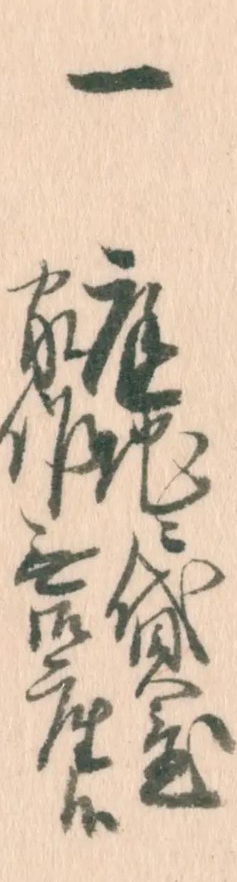一庭地ニ貸置
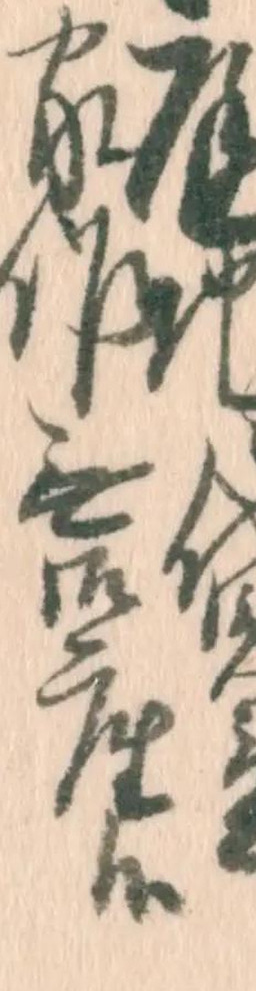家作無御座候
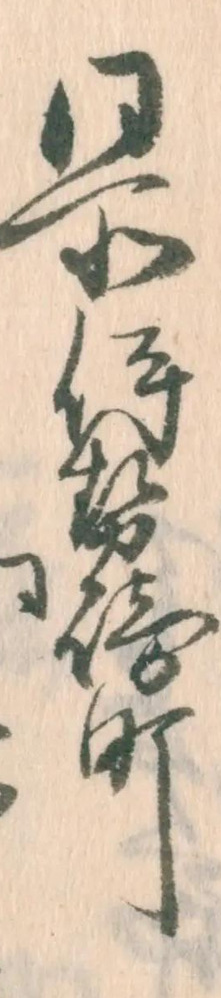〆同所伊勢崎町
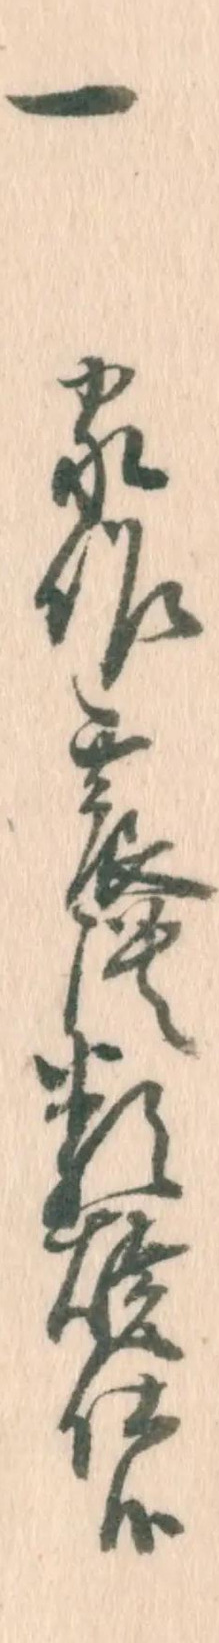一家作震潰類焼仕候
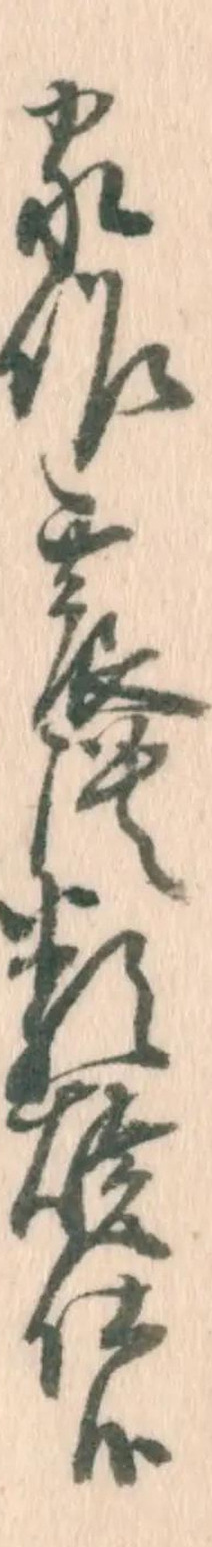一家作震潰類焼仕候
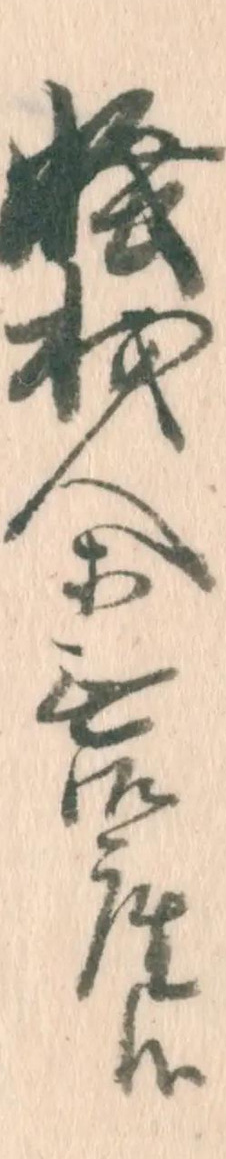一怪我人等無御座候
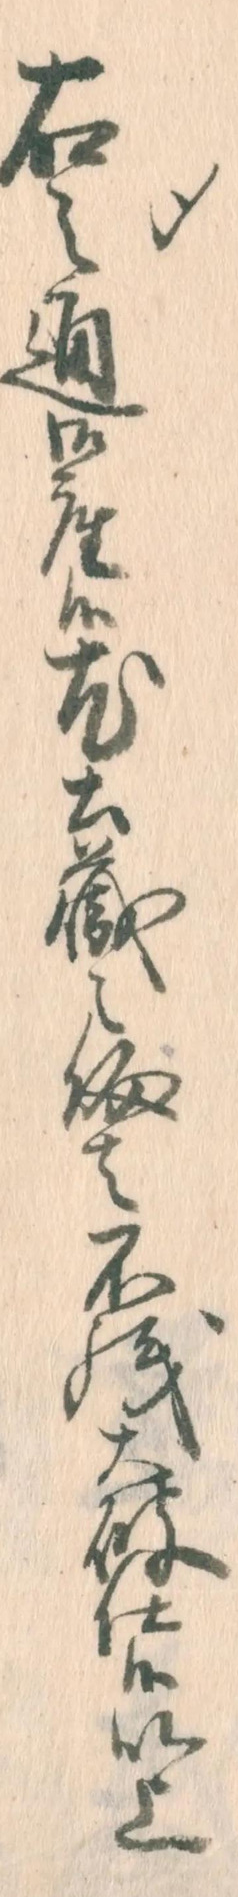右之通御座候尤土蔵之儀は不残大破仕候以上
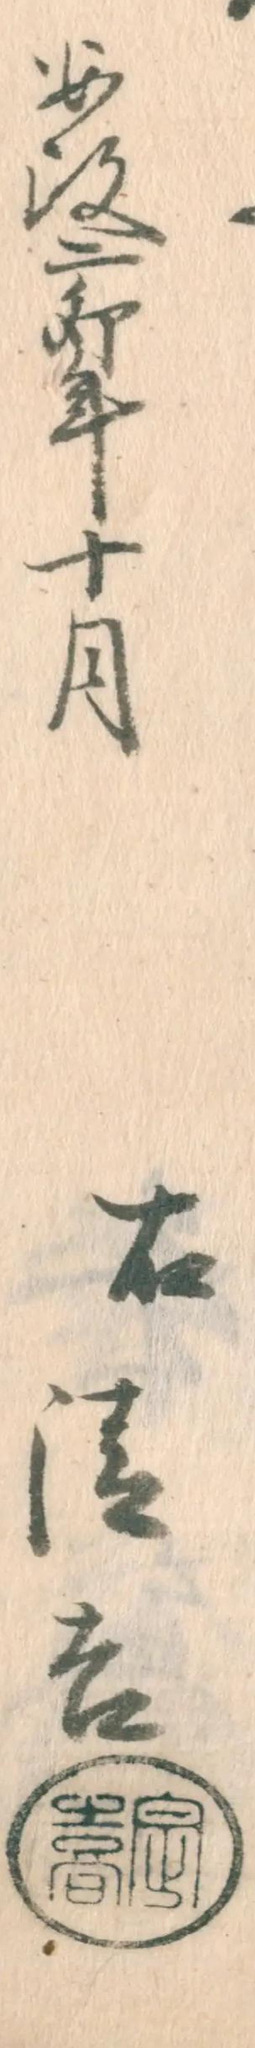安政二卯年十月右清吉
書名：地震災書留 2巻. [1] 内表紙に「地震災書留　安政二卯年　但本所深川御用屋敷地代免除調」とあり
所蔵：国立国会図書館 National Diet Library, JAPAN
